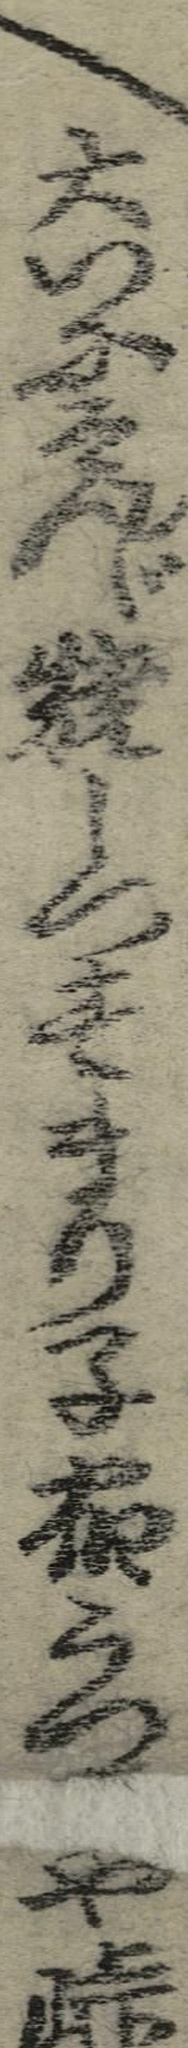大いに損じ焼しつすまり子宿うつのや峠
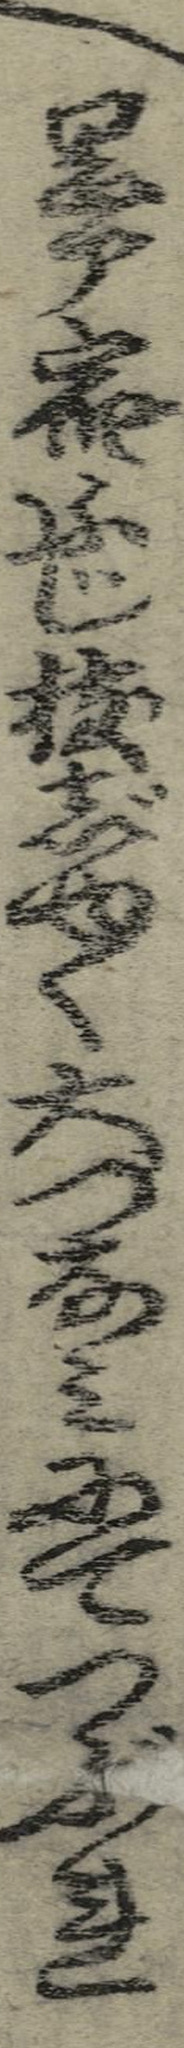岡部宿ふじ枝じゆく大つなミにてつぶれ
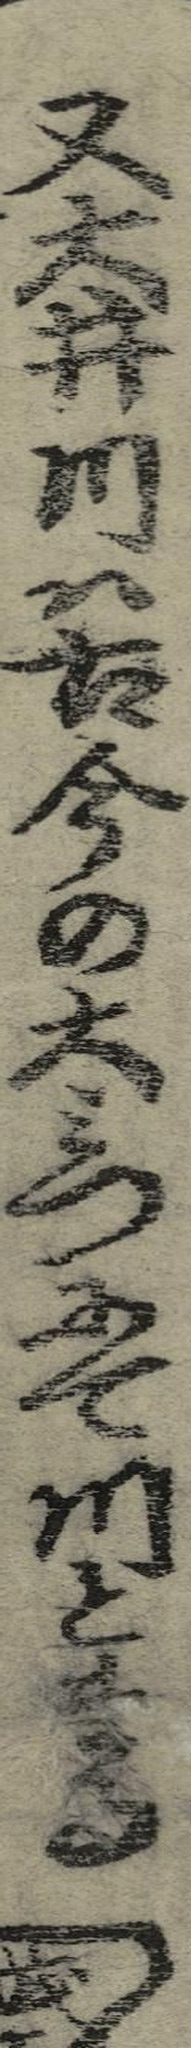又大井川ハ古今の大ミつにて川となる
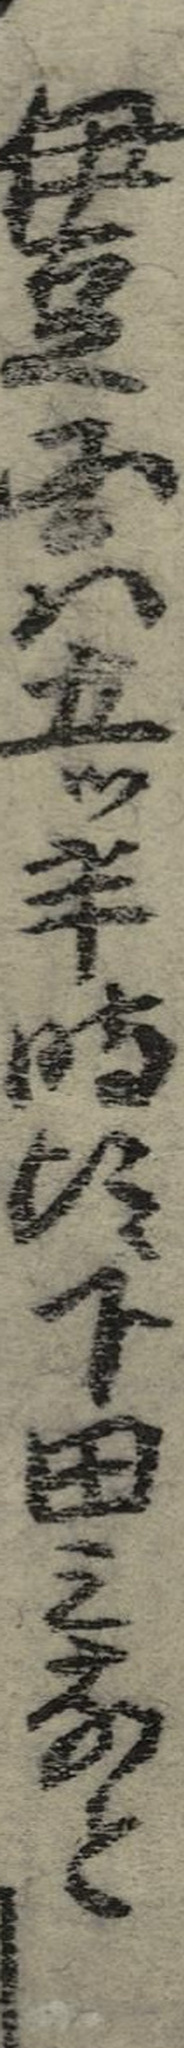伊豆国ハ五ツ半時頃ニ下田ミなと
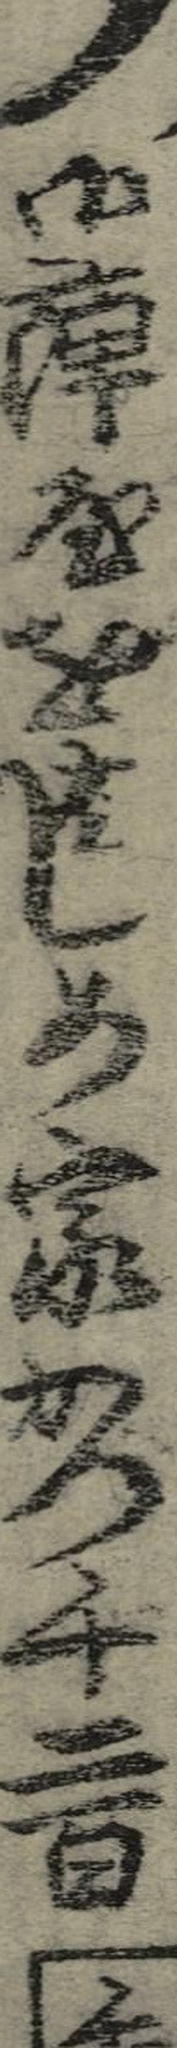御陣屋をはしめ家のかつ千二百
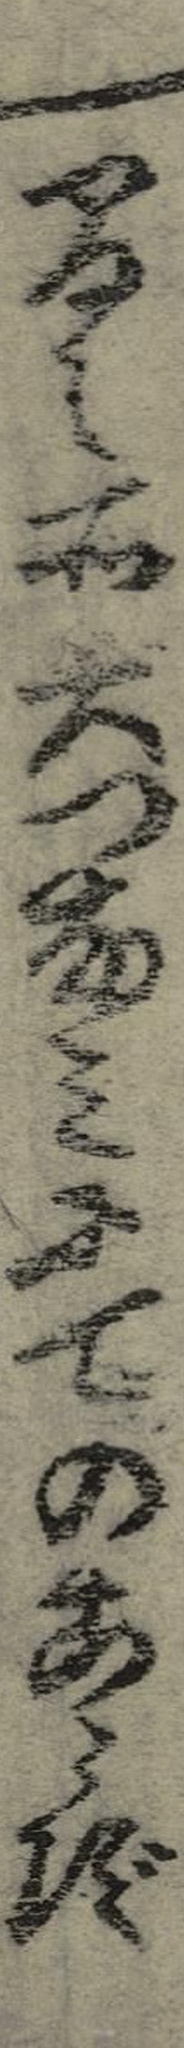間之所大つなミにてのあらず
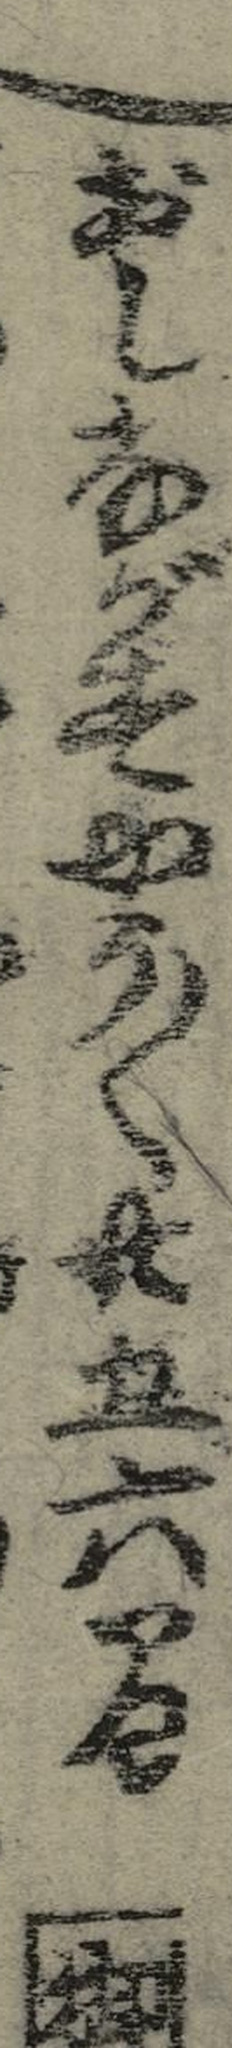おしながすやう〳〵廿五六間
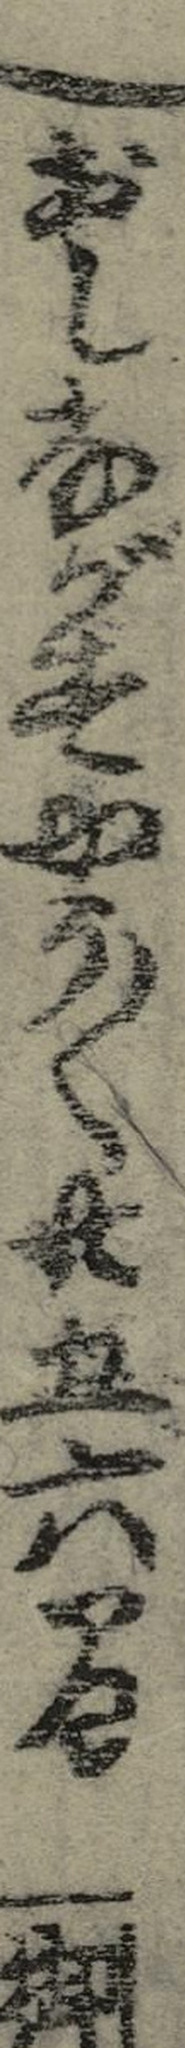おしながすやう〳〵廿五六間
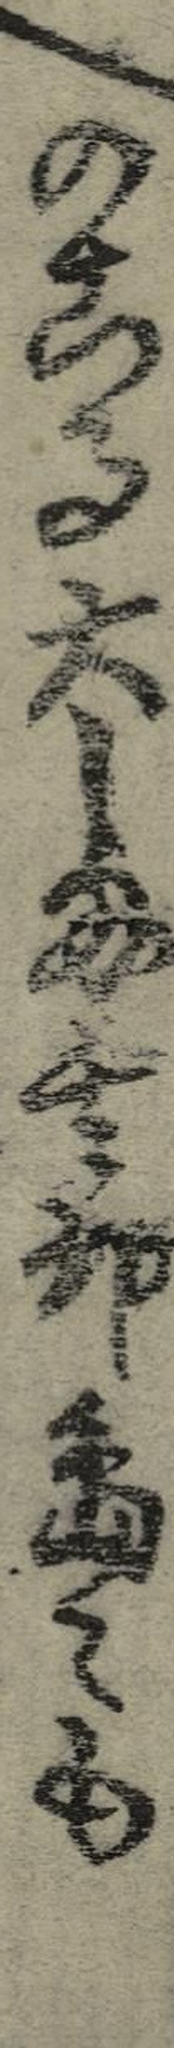のこる大しま其外島々も
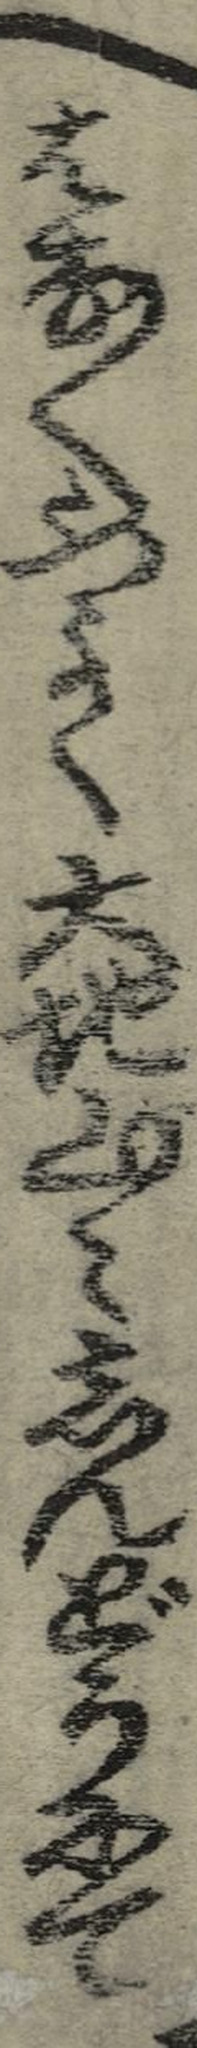はなくふき大地山々しんどうにて
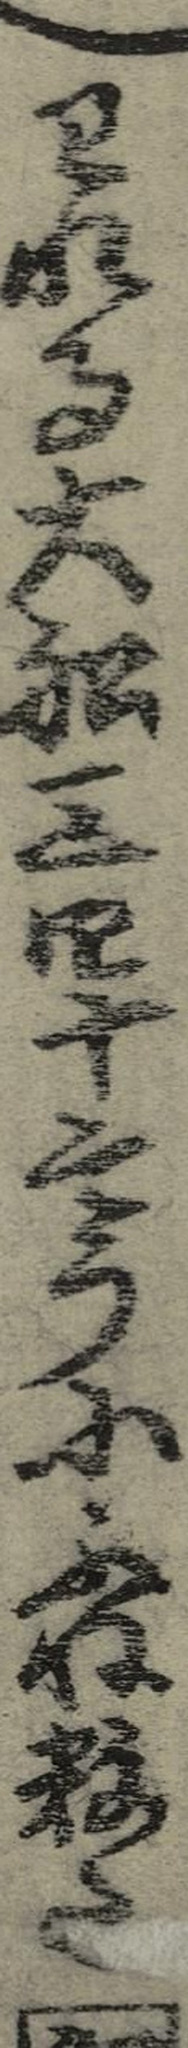われる大船三四十そう小ふね数た
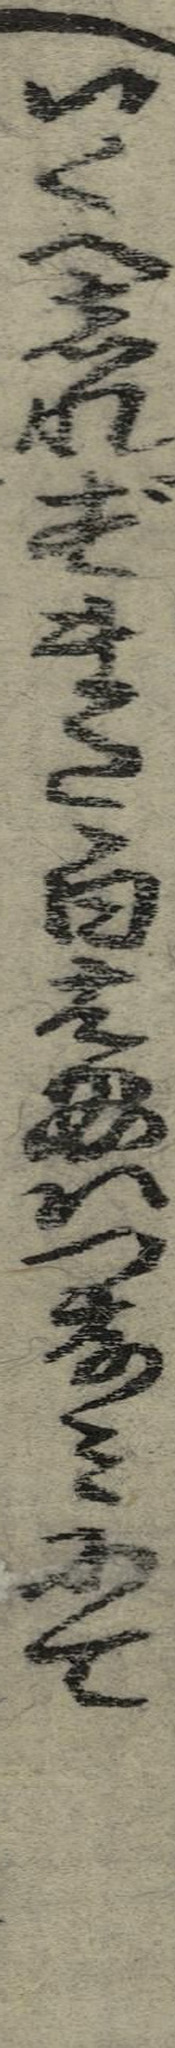いくへしれずまた白はまハつなミにて
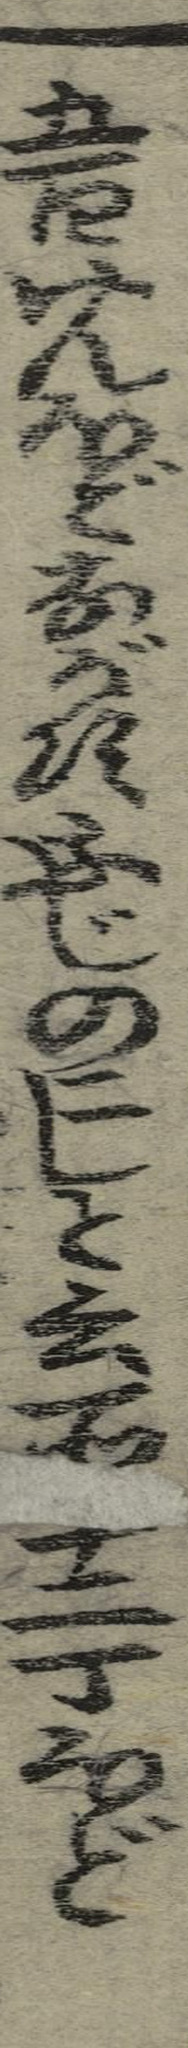五百けんほどながすふじのニしと云所十二丁ほど
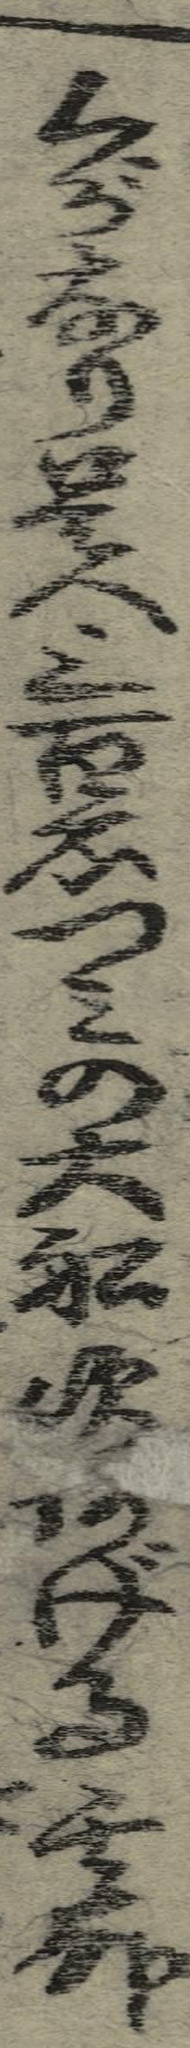くがなり是人三百石つミの大船吹あげる其外
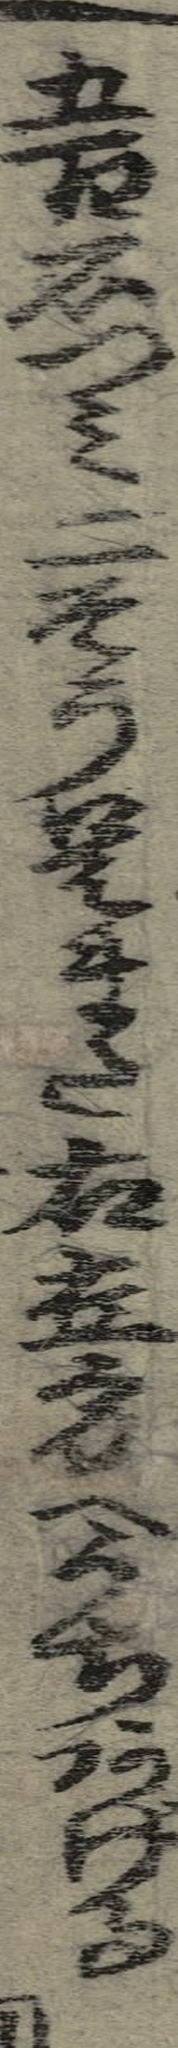五百石つミ二そう是また右在宿へうちあげる
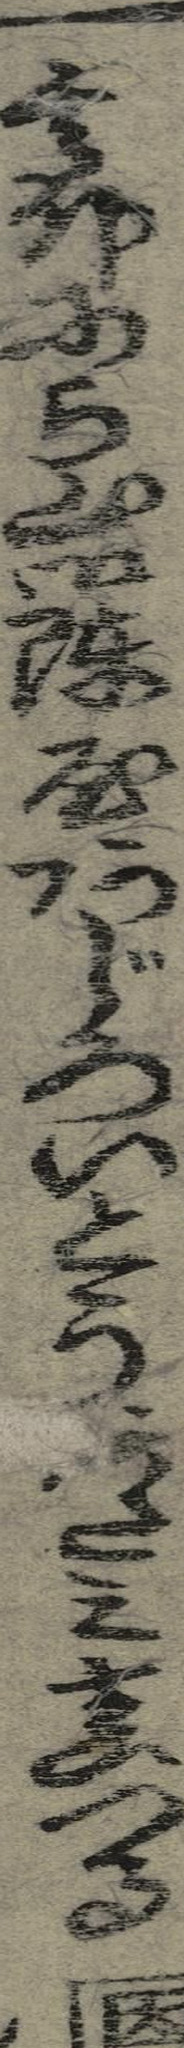其外にら山御陣屋あじろいとうあたみ真つる
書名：諸國大地震并大津浪
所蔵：東京大学地震研究所図書室 Earthquake Research Institute Library, The University of Tokyo, JAPAN
